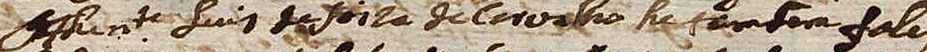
O then.te Luis de Soiza de Carvalho he tambem fales
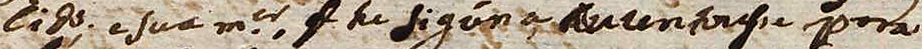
cido; e sua m.er, q̄ he vigária, auzentousse para
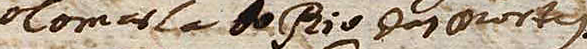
a Comarca do Rio das mortes.
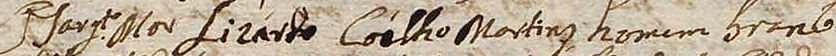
Sarg.to Mor Lizardo Coelho Martins homem branco
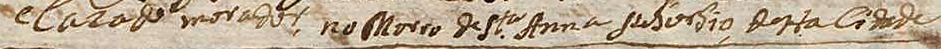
e cazado morador no morro de Sta. Anna suburbio, desta cidade.
